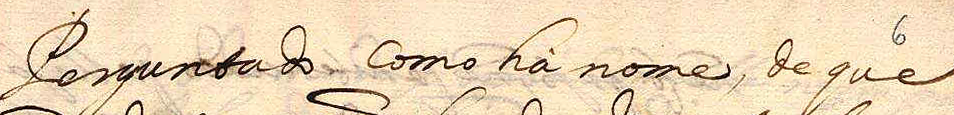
Perguntado como ha nome, de que
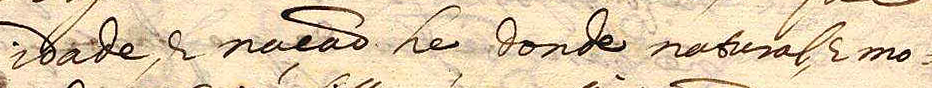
idade, e nação he donde natural, E mo
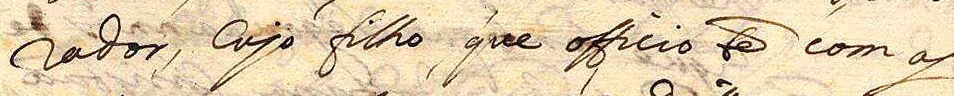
rador, cujo filho que officio tē com as
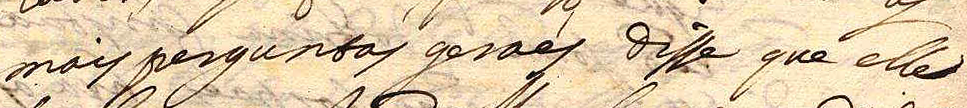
mais perguntas geraes disse que elle
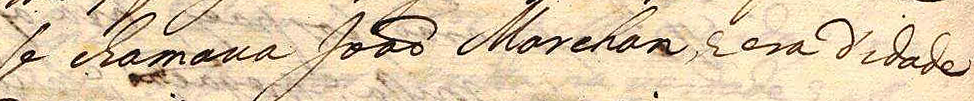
se chamaua João Marchan, E era d'idade
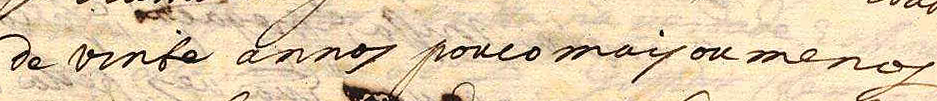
de vinte annos pouco mais ou menos
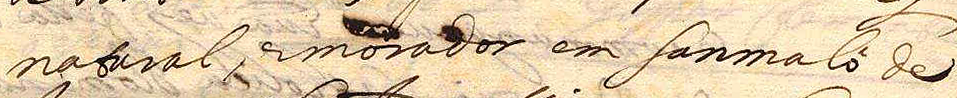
natural, e morador em san Maló de
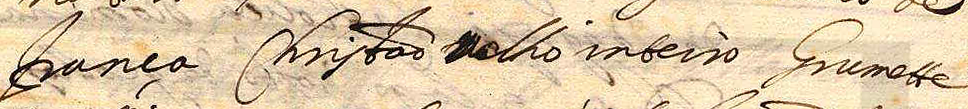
frança Christão velho inteiro Grumette
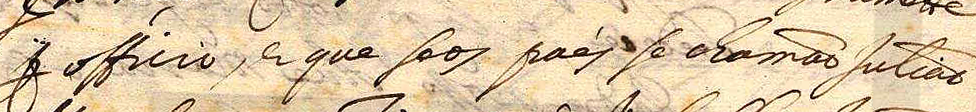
ꝑ officio, E que seos paes se chamão Juliaõ
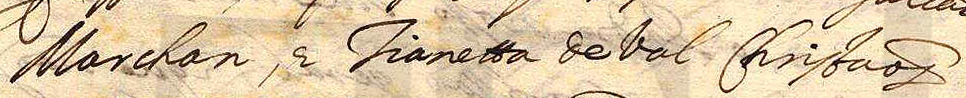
Marchan, E Jianetta de val Christaõs
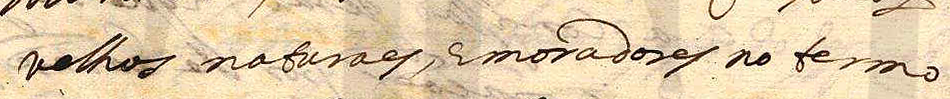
velhos naturaes, E moradores no termo
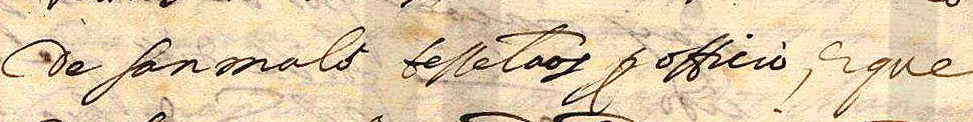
de san maló tesselãos ꝑ officio, E que
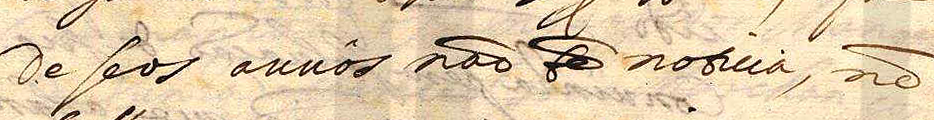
de seos auuós não tē noticia, nē
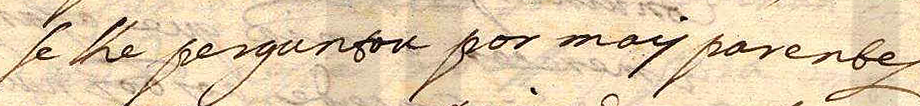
se lhe perguntou por mais parentes
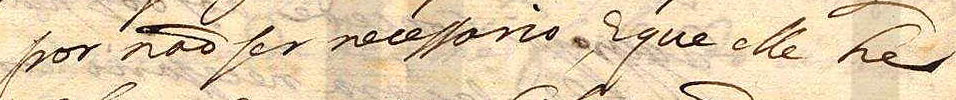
por não ser necessario, E que elle he
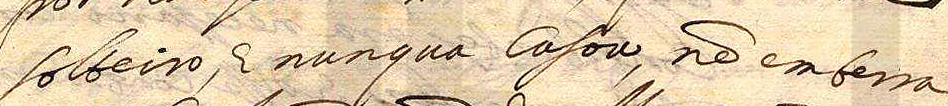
solteiro, E nunqua casou, nē em terra
